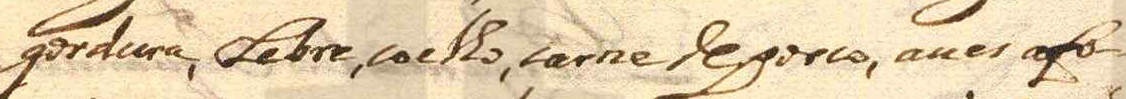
gordura, Lebre, coelho, carne de porco, aues afo
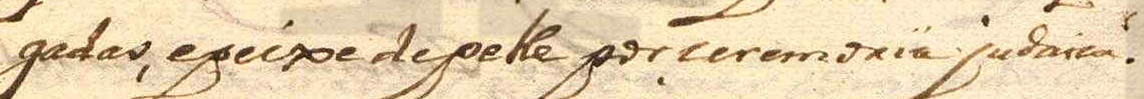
gadas, e peixe de pelle por çeremonia judaica.
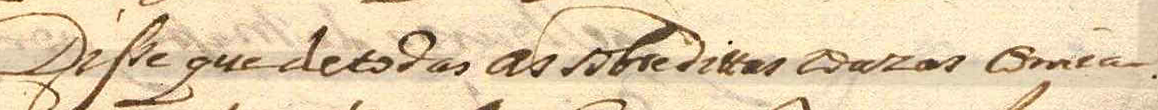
Disse que de todas as sobredittas couzas comia
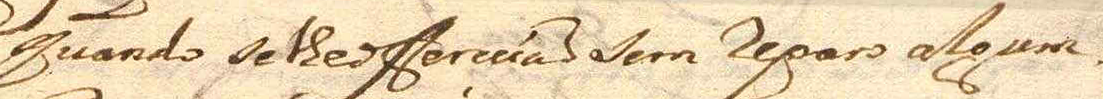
quando se lhe offereçiaõ sem reparo algum
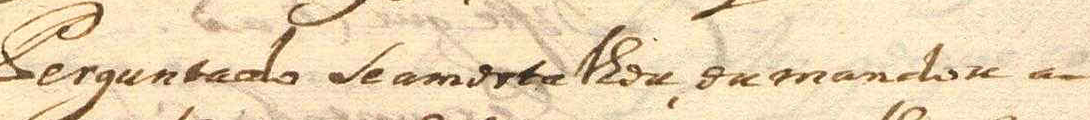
Perguntado se amortalhou, ou mandar a
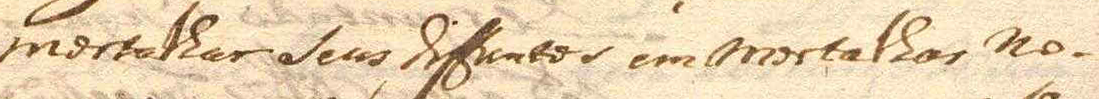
mortalhar seus diffuntos em mortalhas no
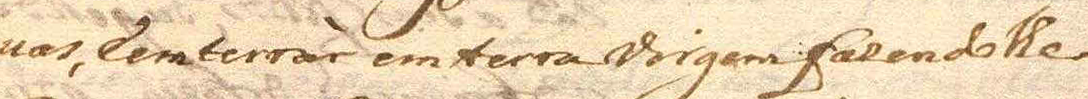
uas, ē emterrar em terra Virgem fazendolhe
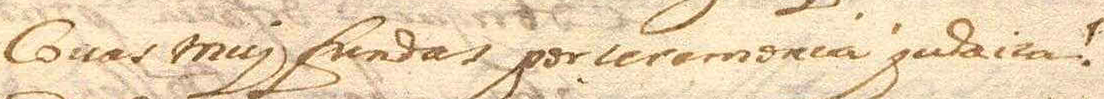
Couas muj fundas por ceremonia judaica?
